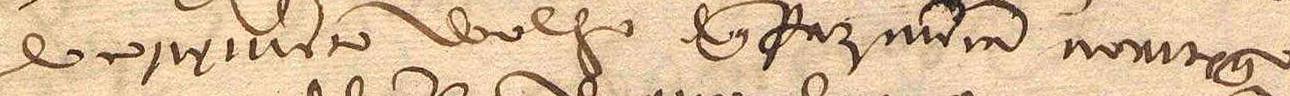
do corrymēto do olho de q̄ faz mēcā no artygo
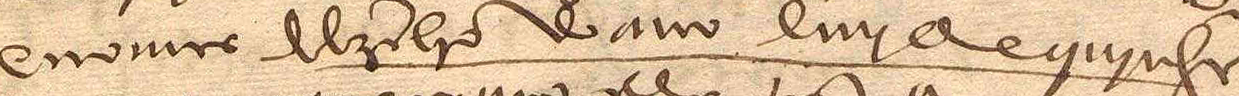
e no mes de dezēbro do ano de myll e qujnhē
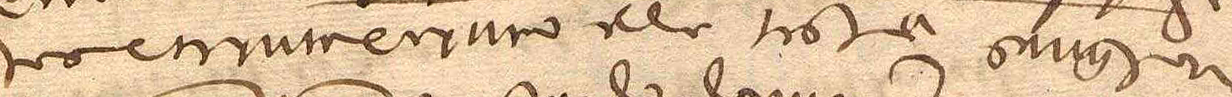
tos e trynta e cynco elle testa sangrou
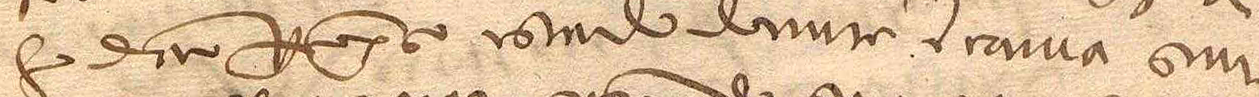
ho dīto Reo p̄so estando doemte ē cama sem
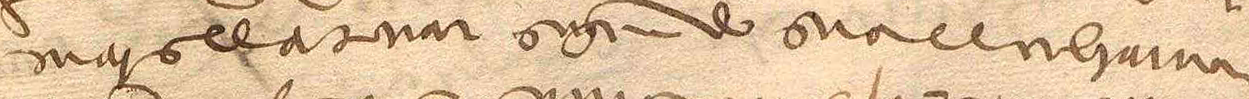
majs lla tornar segūndo sua llenbranca
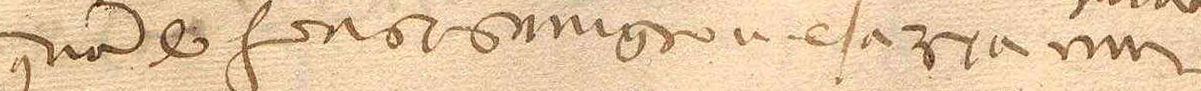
q̄uādo ho asy samgrou e Jazya em
